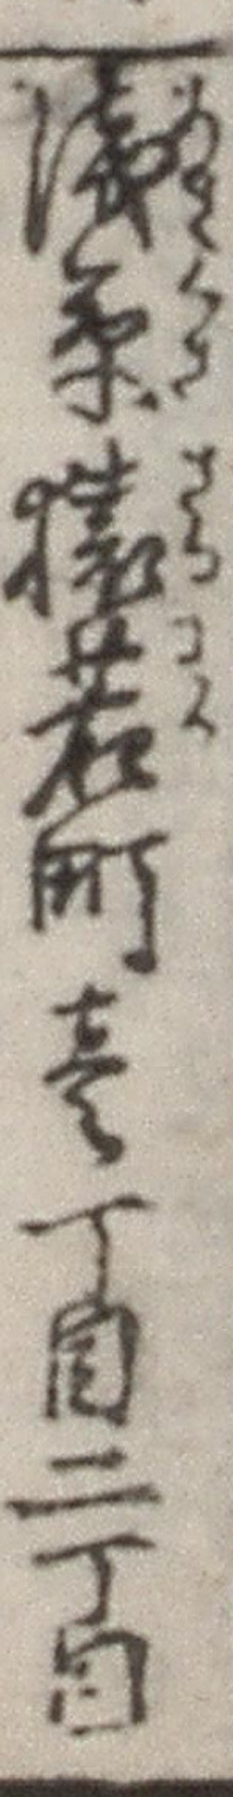浅草猿若町壱丁目二丁目
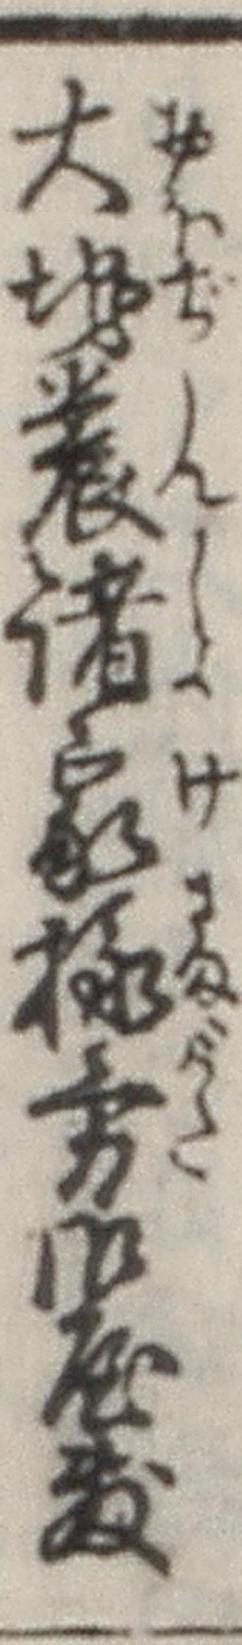大地震諸家様方御屋敷
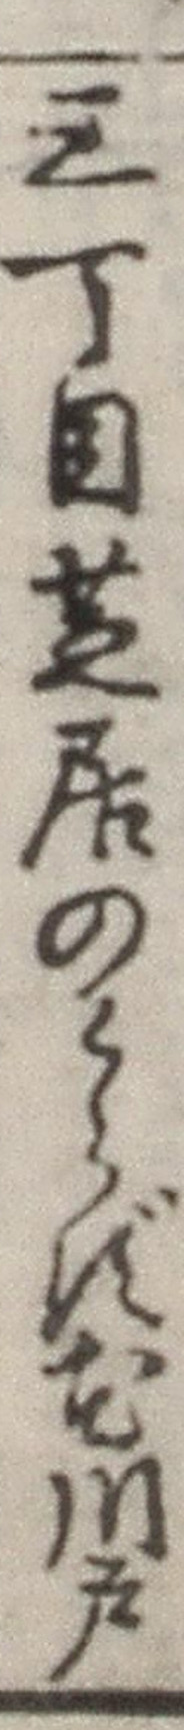三丁目芝居のこらず花川戸
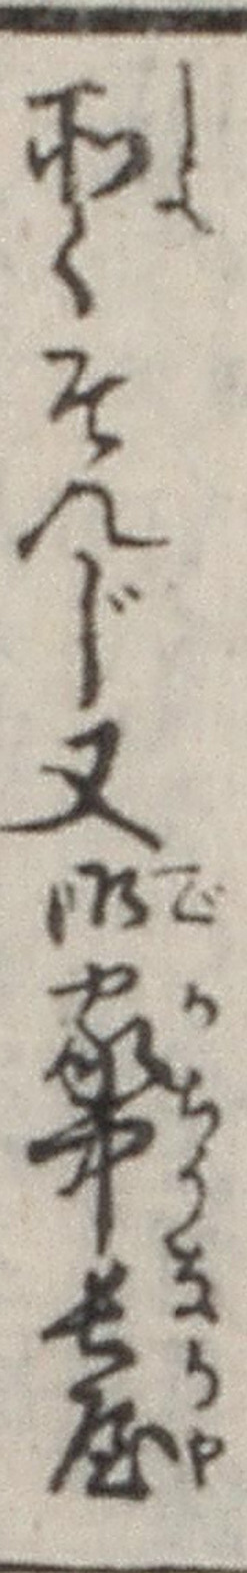所々そんじ又御家中長屋
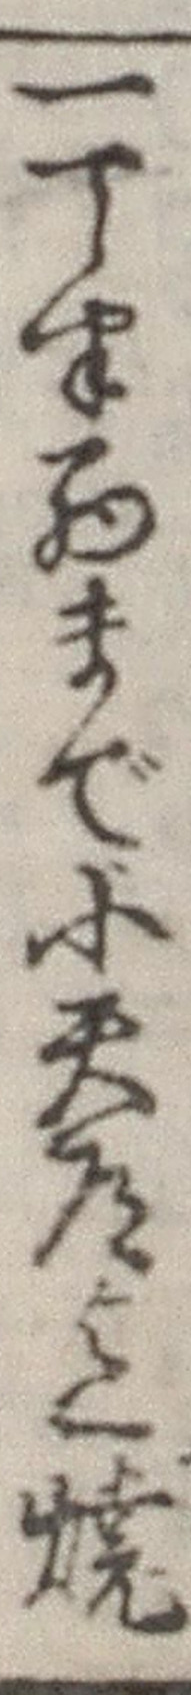一丁半西まで小天道迄焼
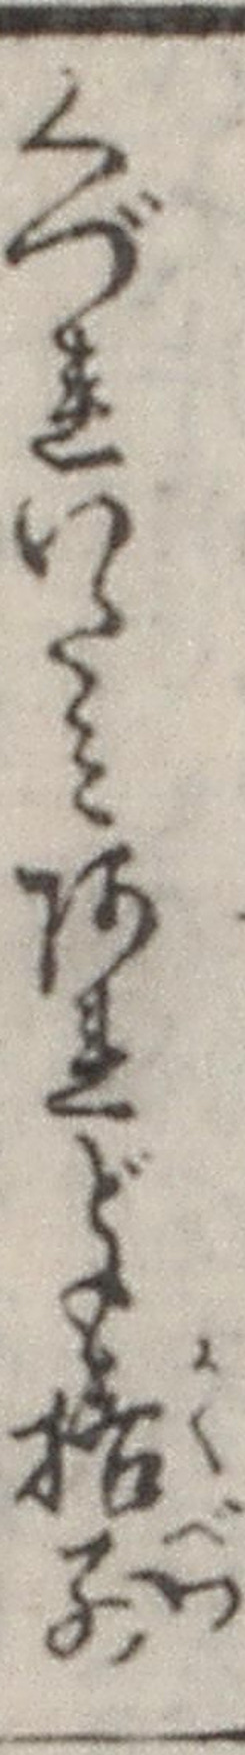くづれいたみあれども格別
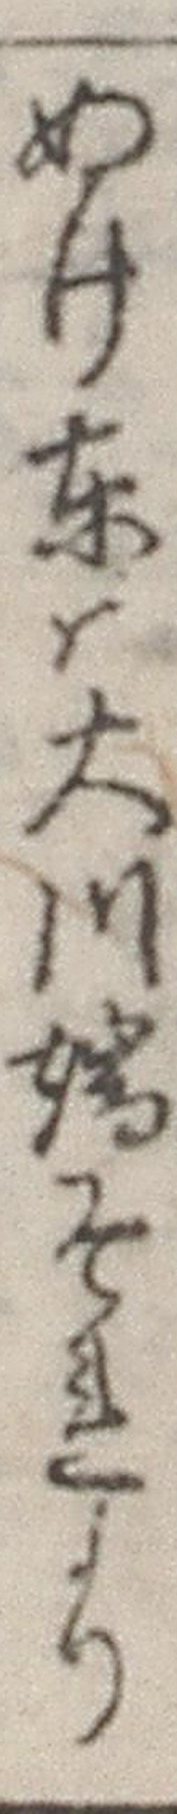ぬけ東は大川端それより
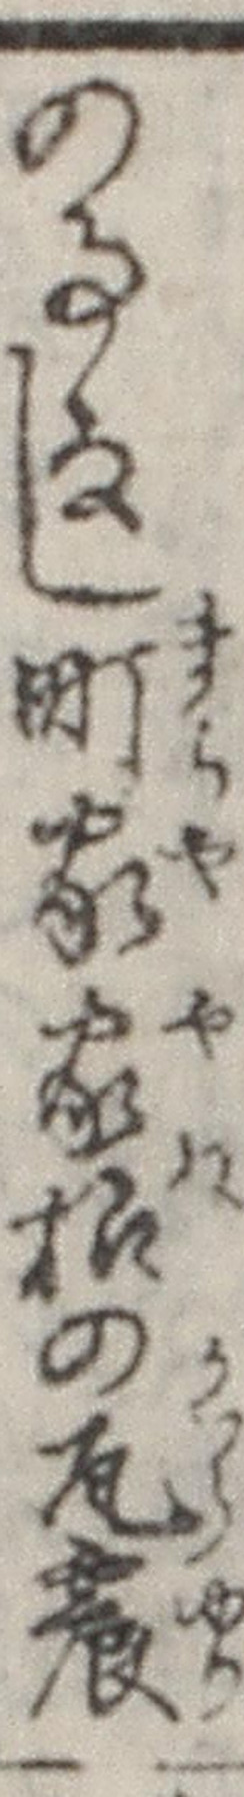の事なし町家家根の瓦震
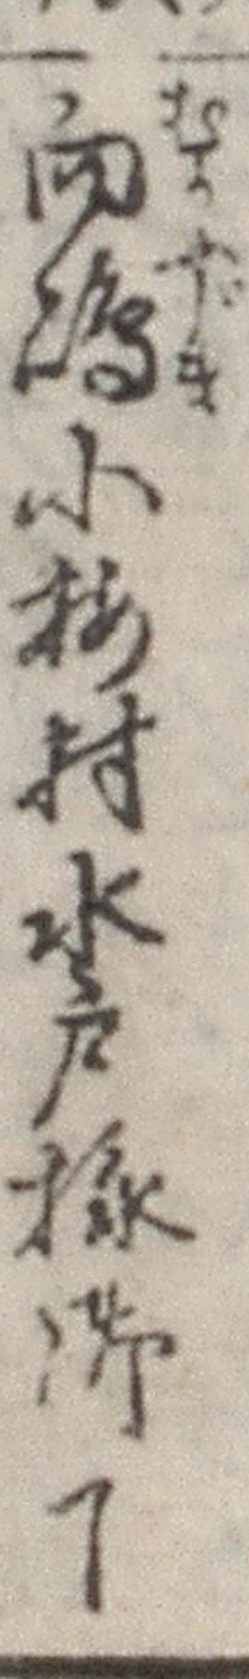向島小梅村水戸様御下
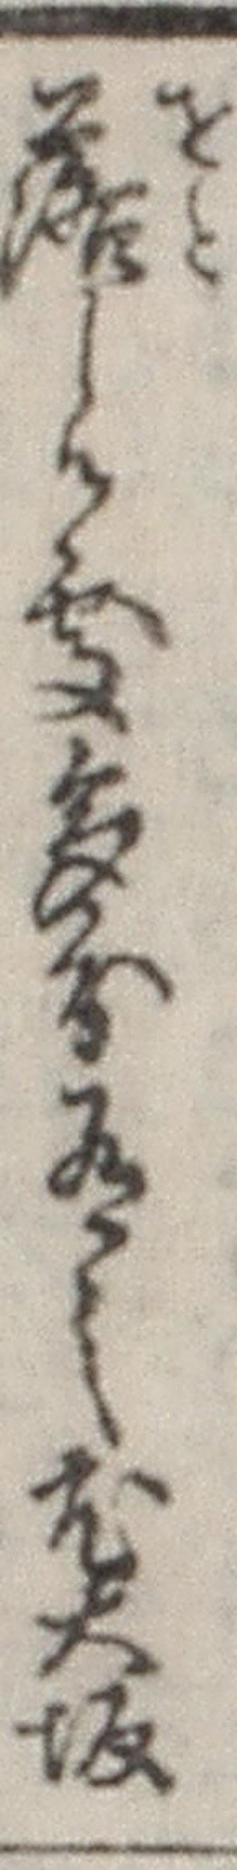落し候處多分有之尤大阪
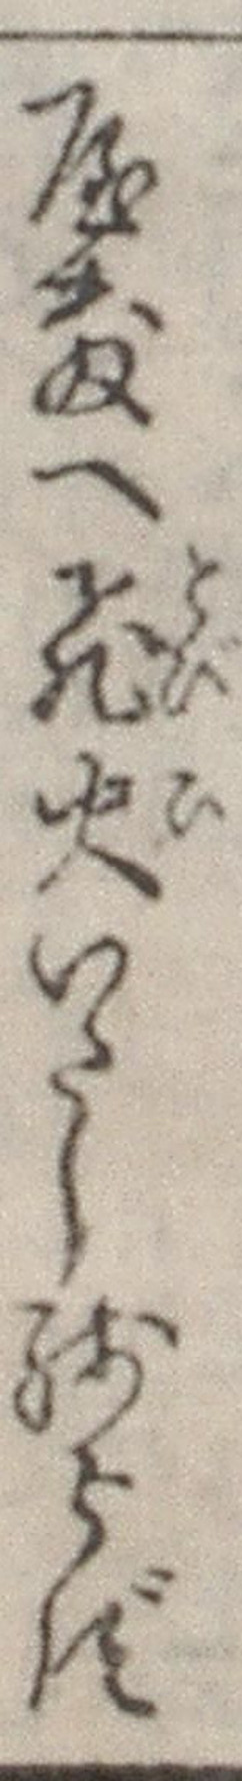屋敷へ飛火いたし残らず
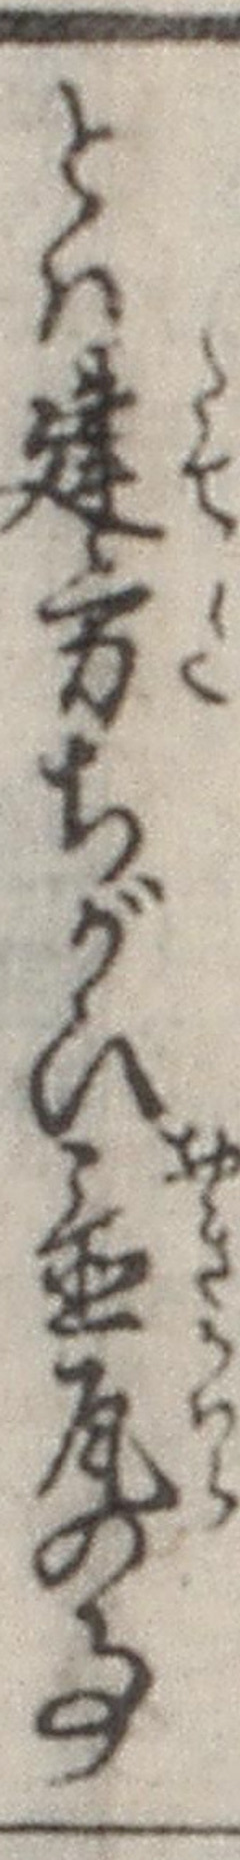とは建方ちがひ置瓦の事
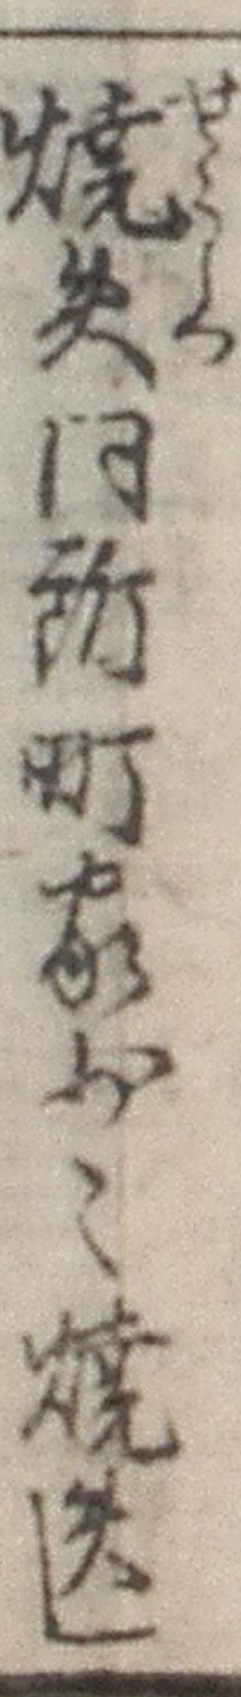焼失同所町家少々焼失し
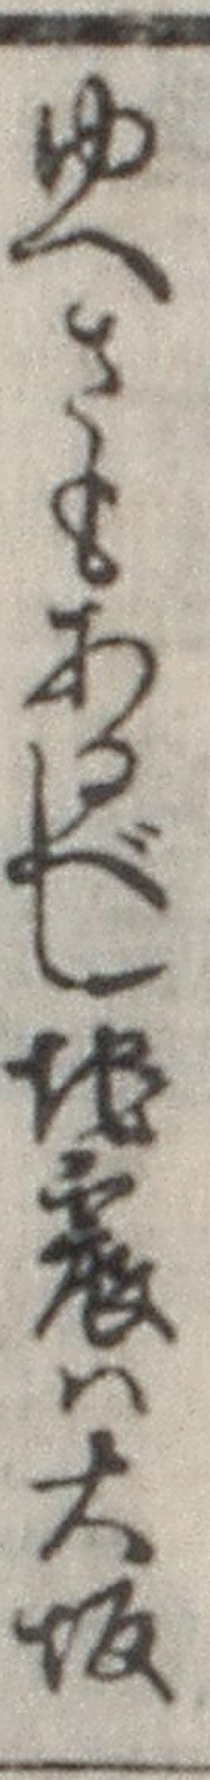ゆへさもあるべし地震は大坂
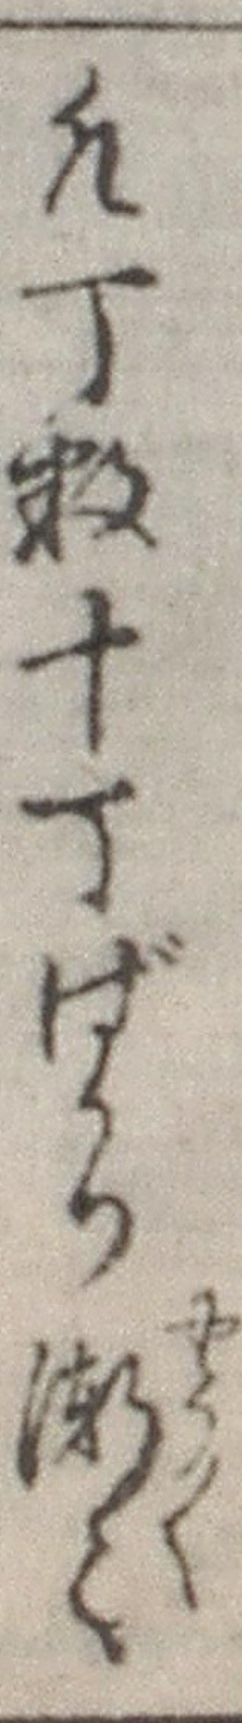凡丁数十丁ばかり漸〻
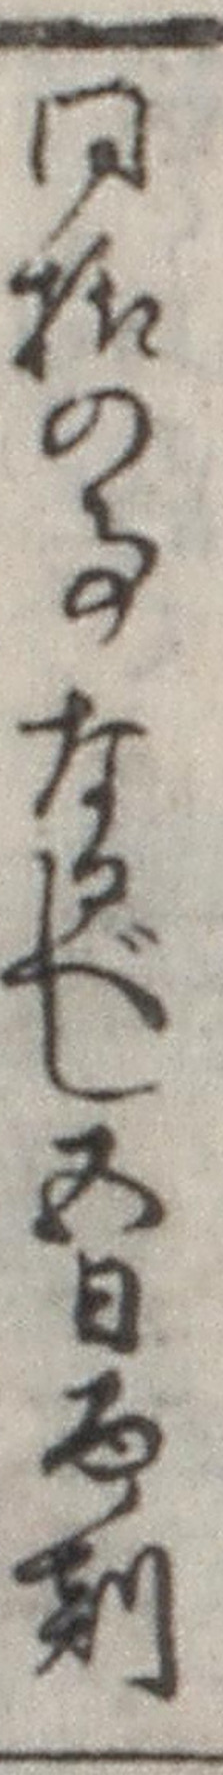同様の事なるべし五日酉ノ刻
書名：諸國大地震年代記　末代噺種
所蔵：東京大学地震研究所図書室 Earthquake Research Institute Library, The University of Tokyo, JAPAN
